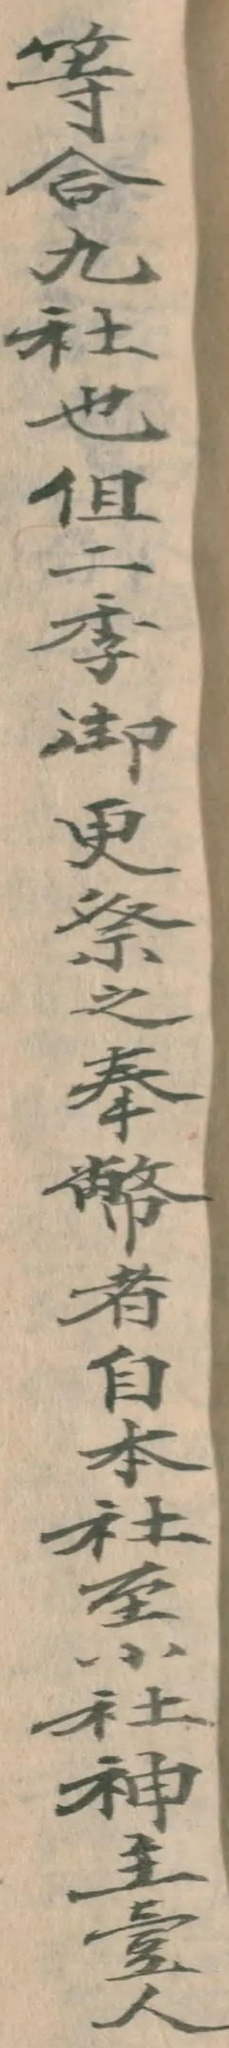等合九社也但二季御更祭之奉幣者自本社至小社神主壱人
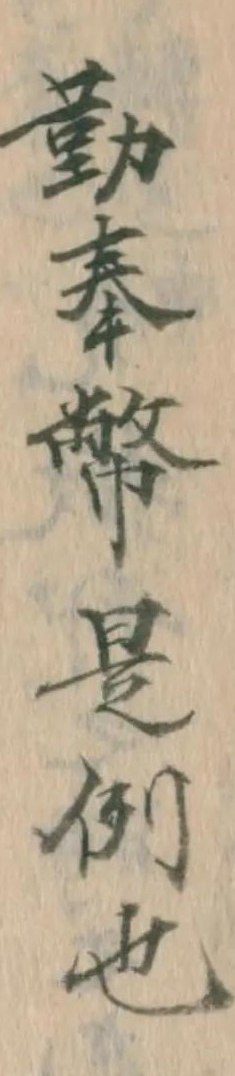勤奉幣是例也
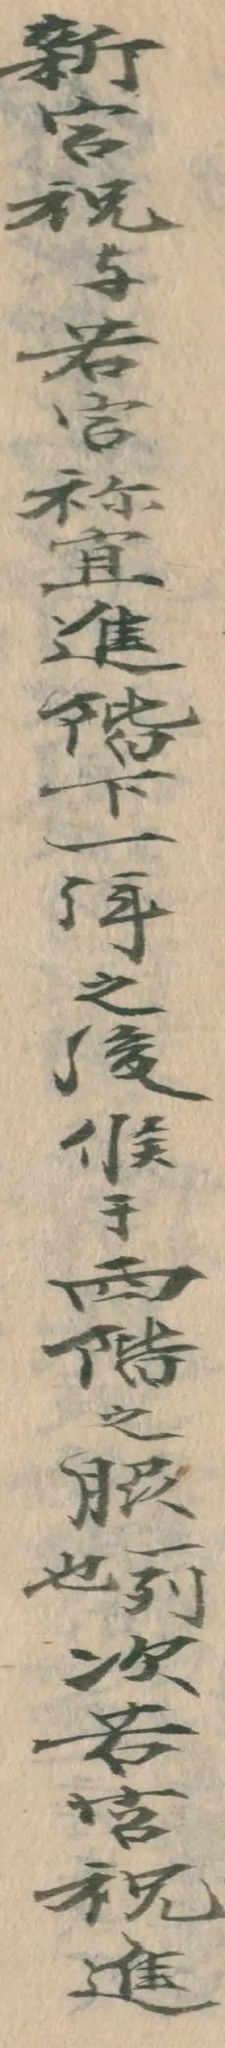新宮祝与若宮祢宜進階下一拝之後候于西階之脇一列也次若宮祝進
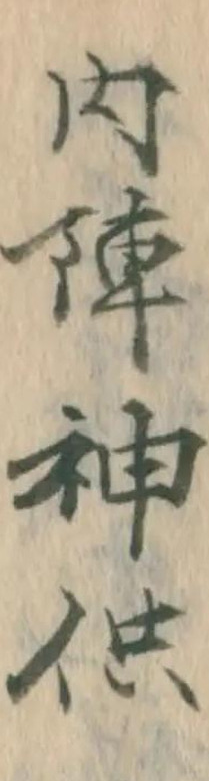内陣神供
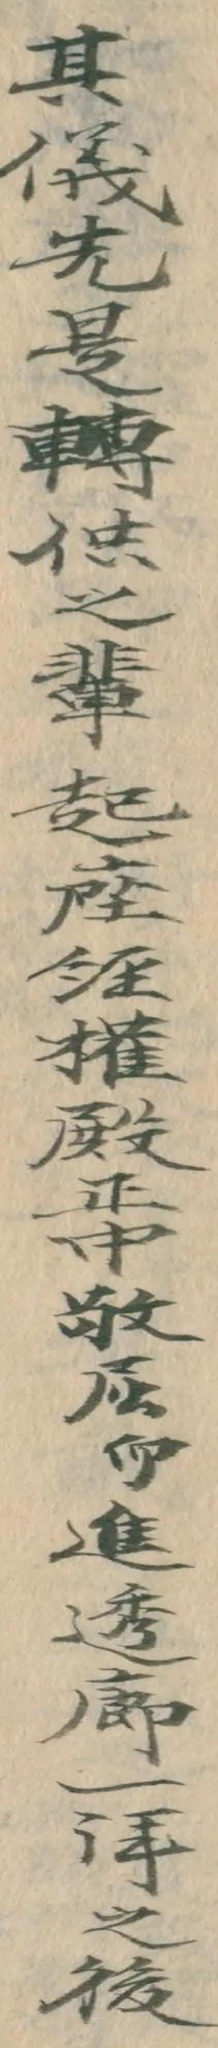其儀先是転供之輩起座経権殿正中敬屈而進透廊一拝之後
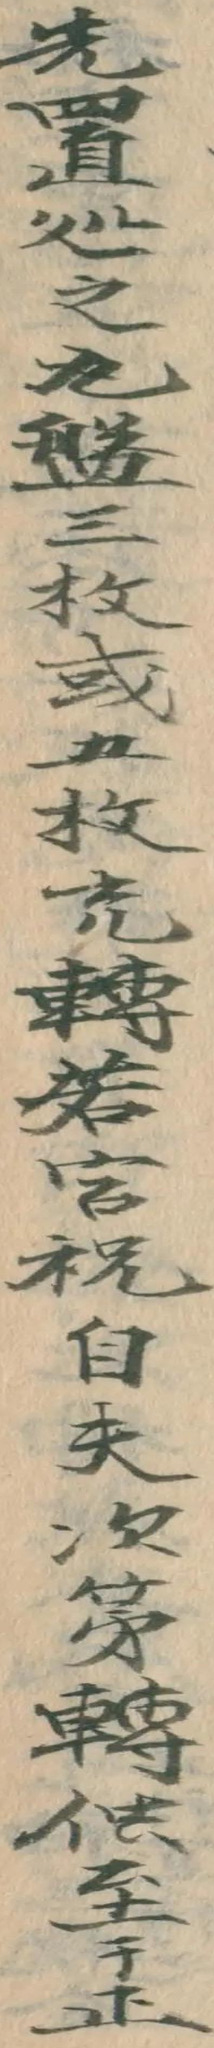先置処之丸盤三枚或五枚充転若宮祝自夫次第転供至于正

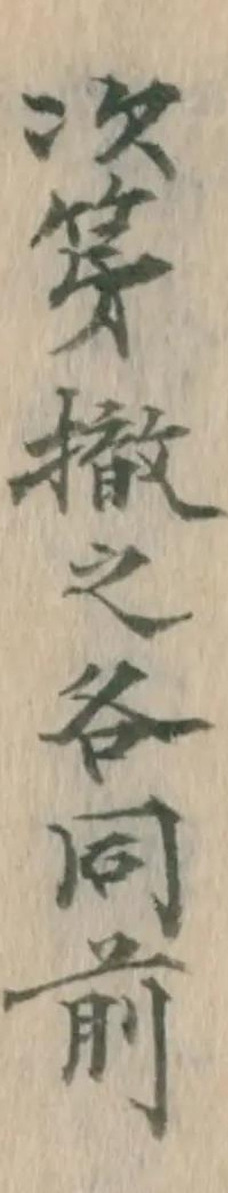次第撤之各同前
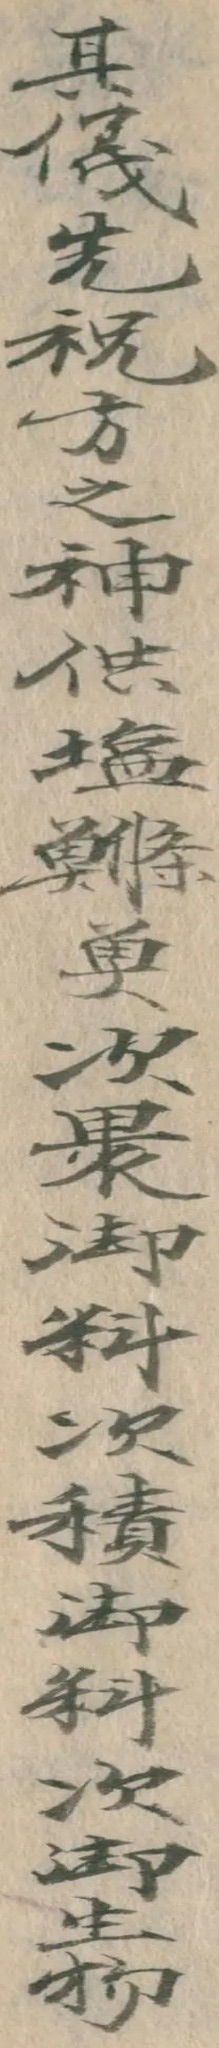其儀先祝方之神供塩鰷魚次裹御料次積御料次御生物
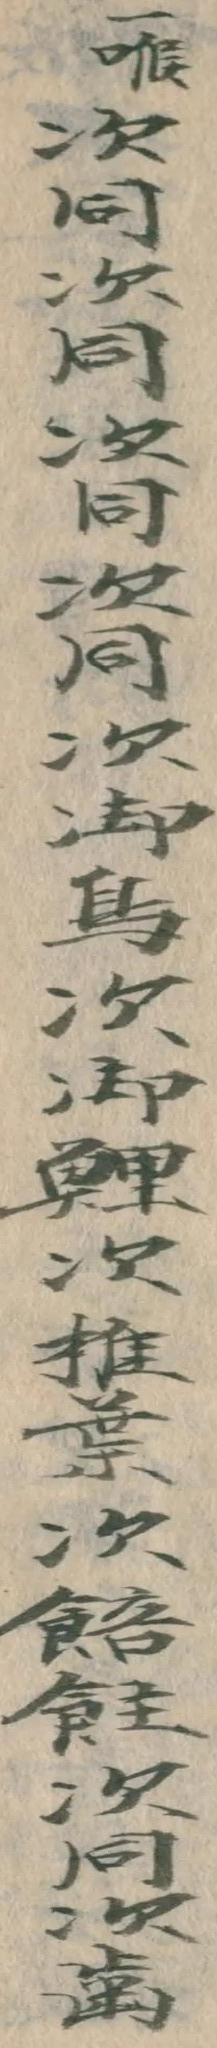一喉次同次同次同次同次御鳥次御鯉次椎葉次餢飳次同吹歯
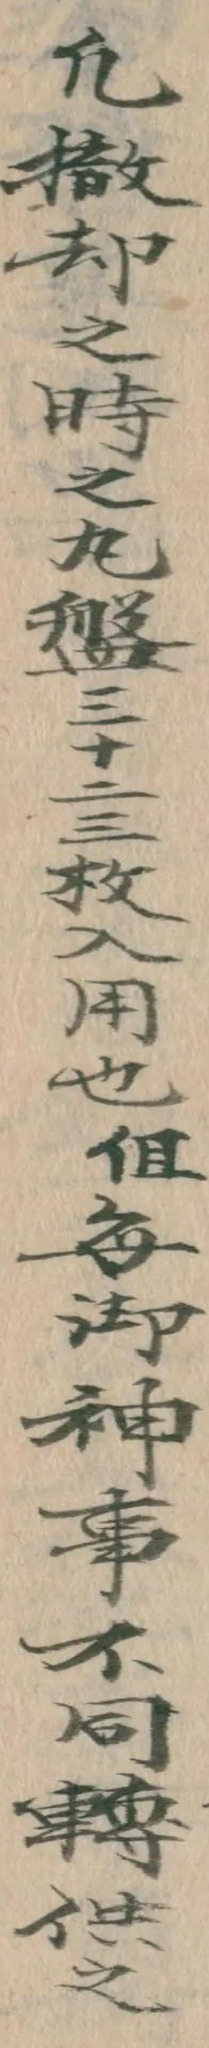凡撤却之時之丸盤三十二三枚入用也但毎御神事不同転供之
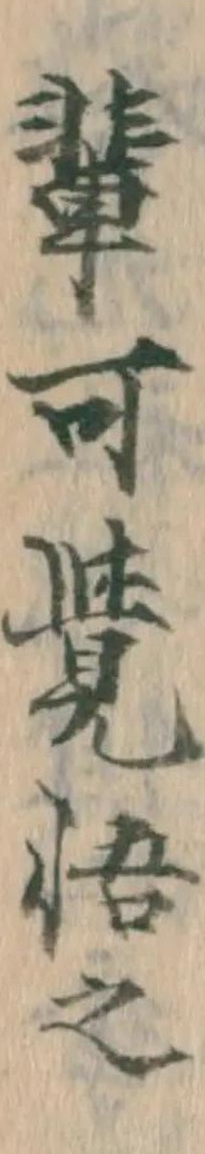輩可覚悟之

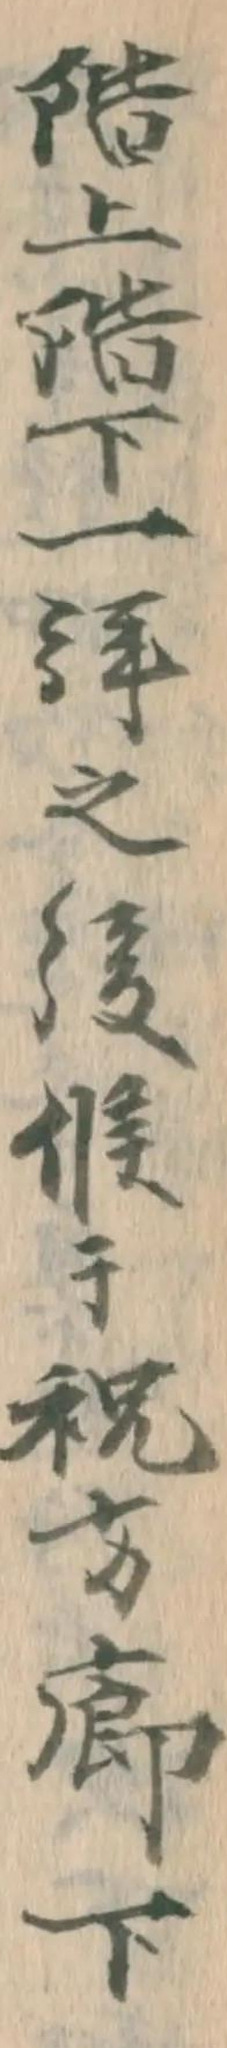階上階下一拝之後候于祝方廊下
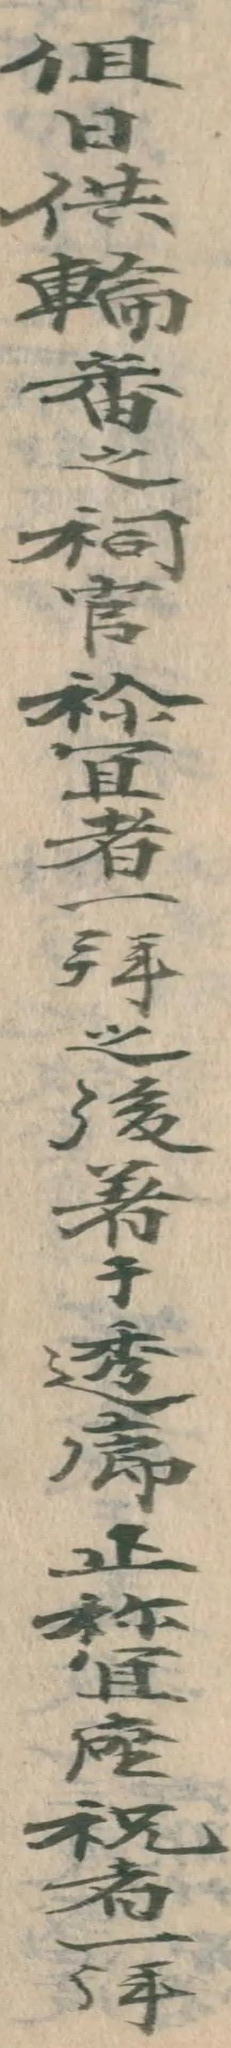但日供輪番之祠官祢宜者一拝之後着于透廊正祢宜座祝者一拝
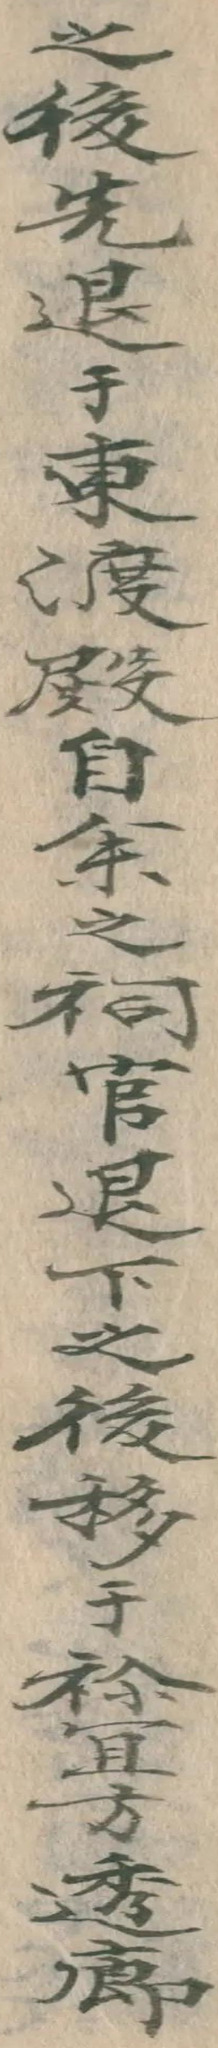之後先退于東渡殿自余之祠官退下之後移于祢宜方透廊
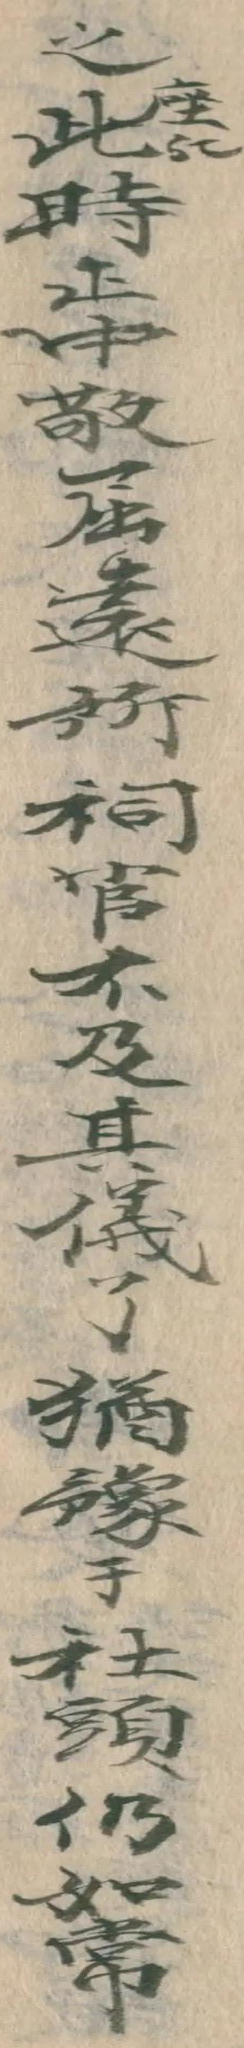之此時正中敬屈遠所祠官不及其儀了猶予于社頭仍如常
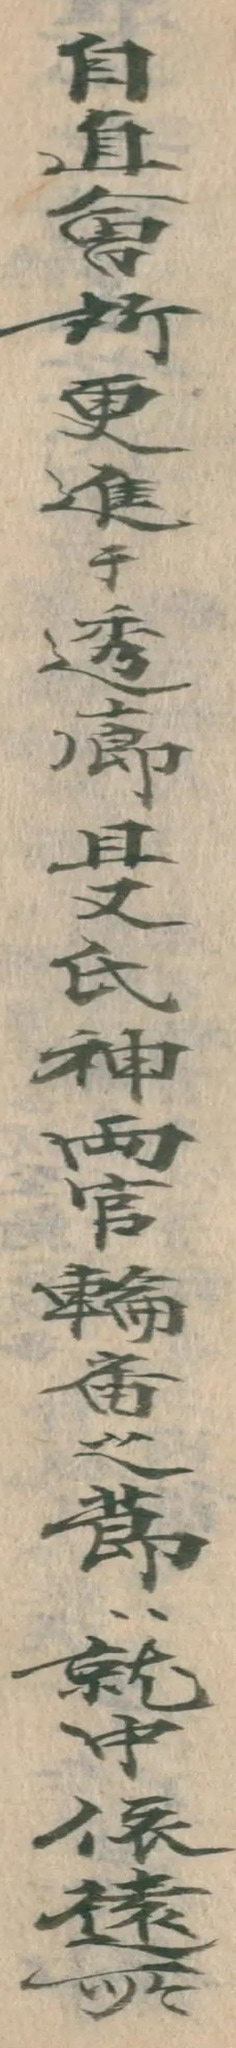自直会所更進于透廊且又氏神両官輪番之節ハ就中依遠所
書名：賀茂社記録. 第9冊
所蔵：国立国会図書館 National Diet Library, JAPAN
